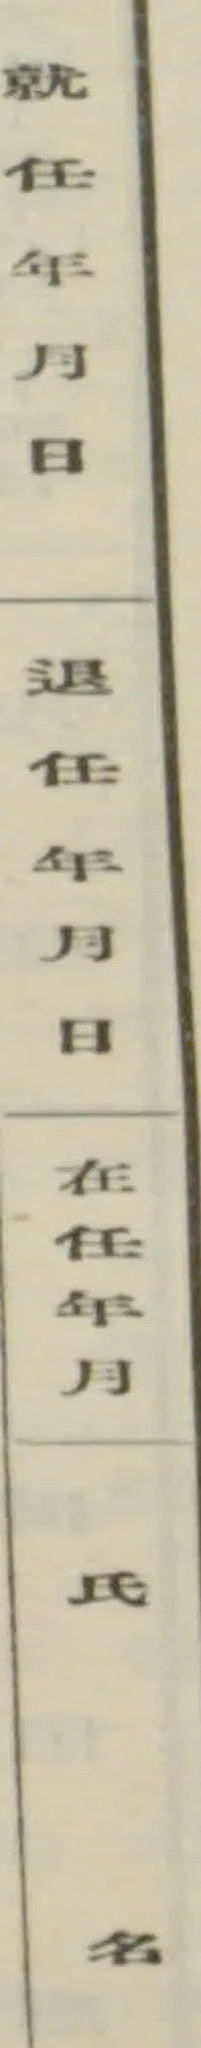就任年月日退任年月日在任年月氏名
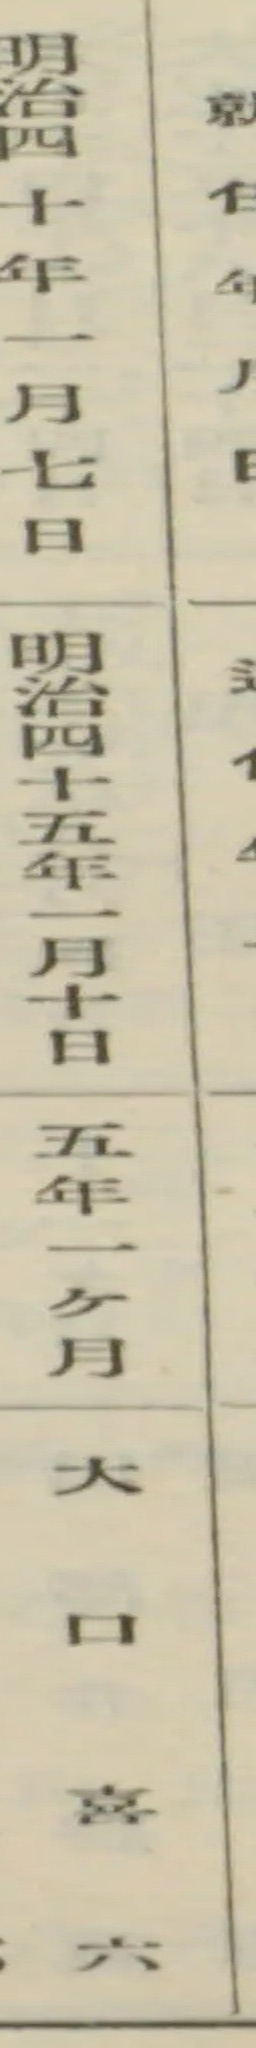明治四十年一月七日明治四十五年一月十日五年一ケ月大口喜六
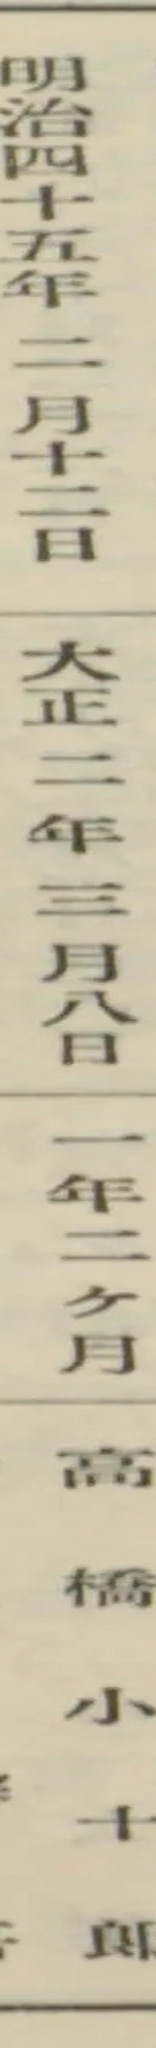明治四十五年二月十二日大正二年三月八日一年二ケ月高橋小十郎
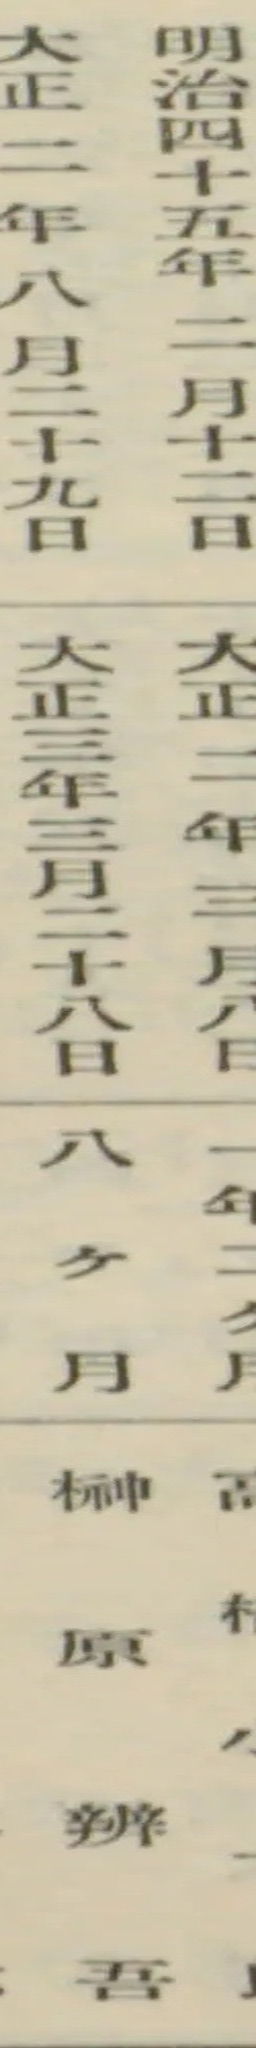大正二年八月二十九日大正三年三月二十八日八ケ月榊原辨吾
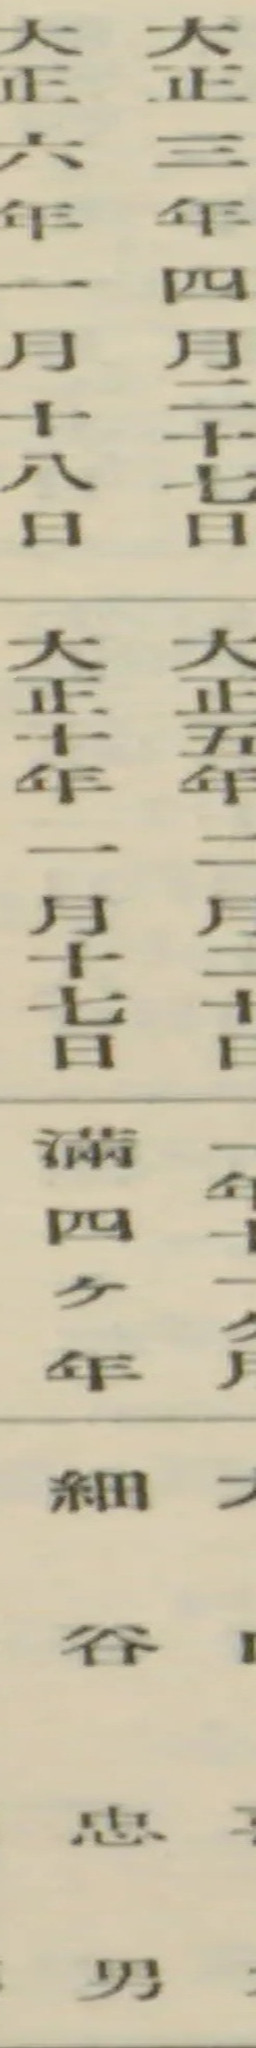大正六年一月十八日大正十年一月十七日満四ケ年細谷忠男
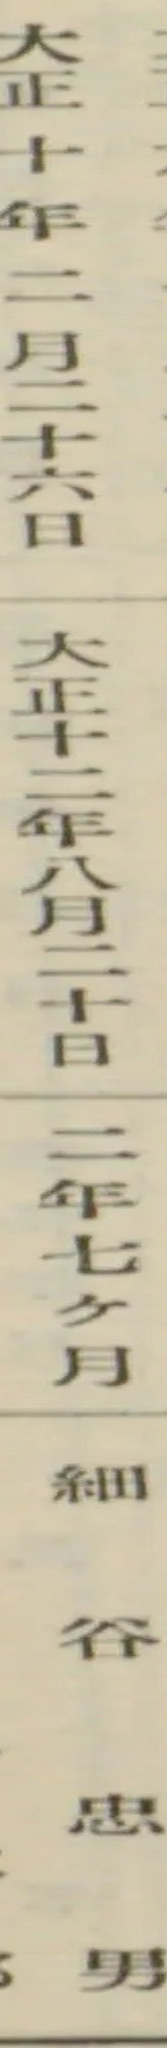大正十年二月二十六日大正十二年八月二十日二年七ケ月細谷忠男
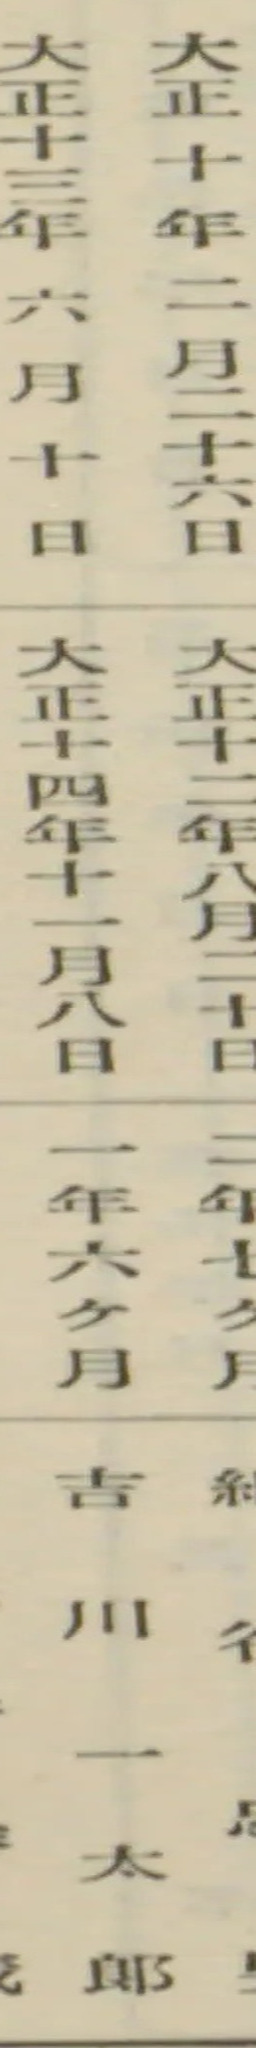大正十三年六月十日大正十四年十一月八日一年六ケ月吉川一太郎
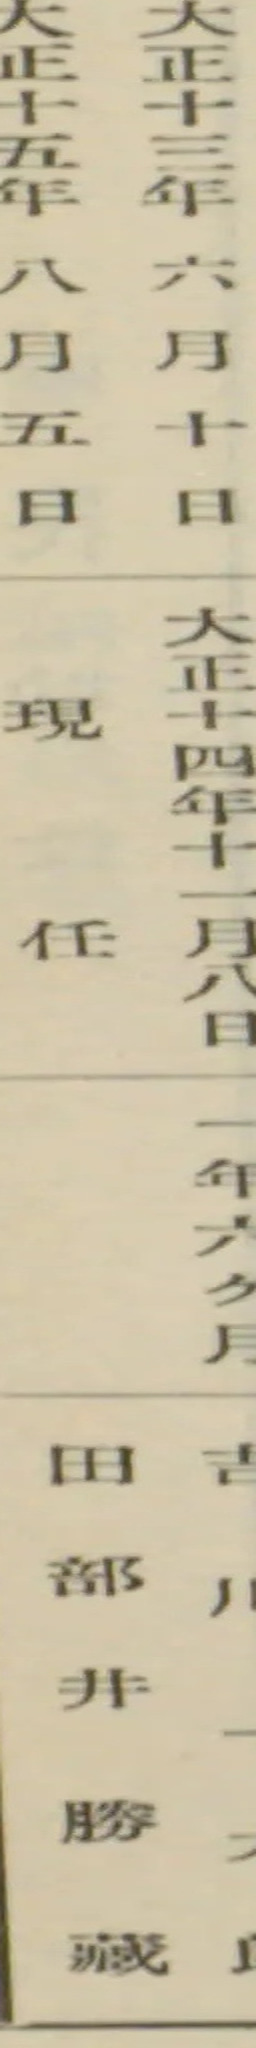大正十五年八月五日現任田部井勝蔵
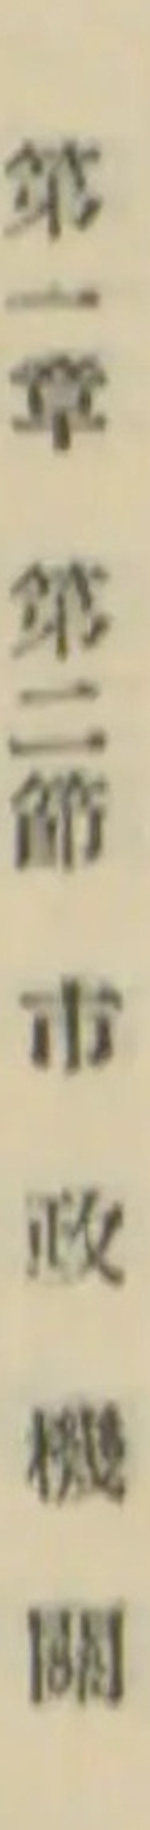第一章第二節市政機関九

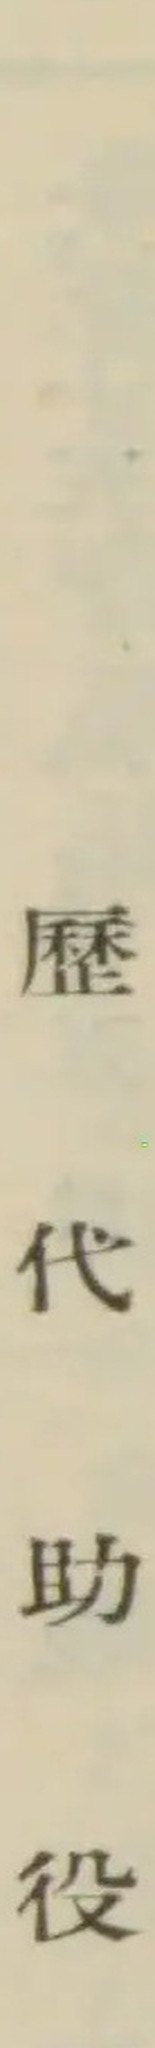歴代助役
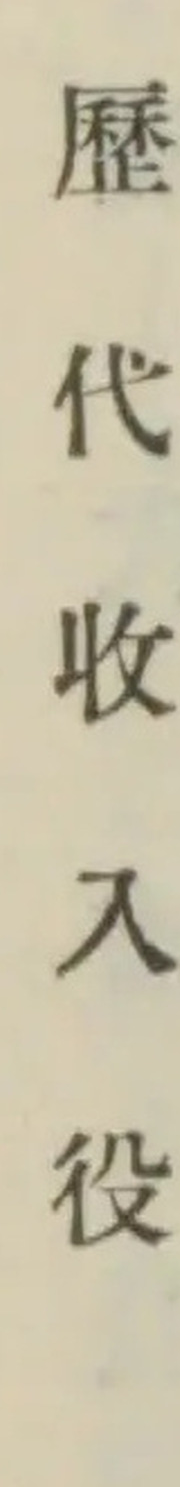歴代収入役
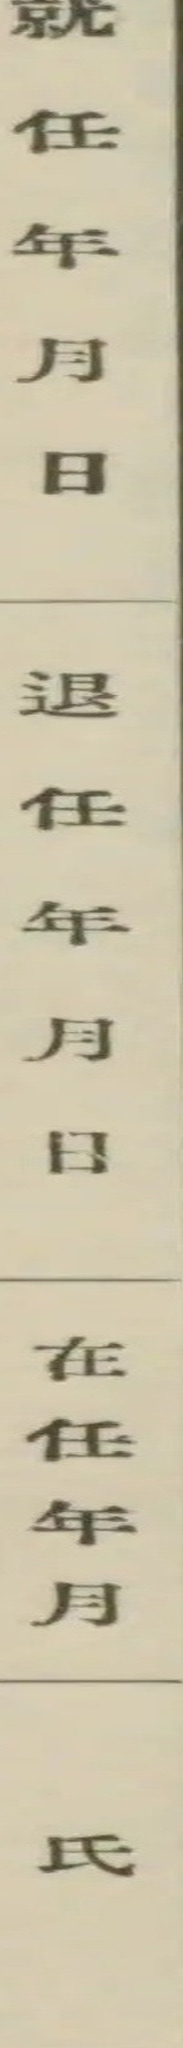就任年月日退任年月日在任期間氏名
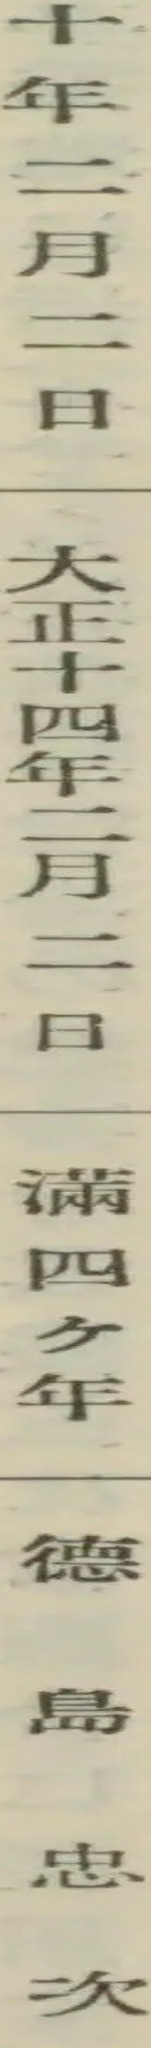大正十年二月二日大正十四年二月二日満ケ四年徳島忠次郎
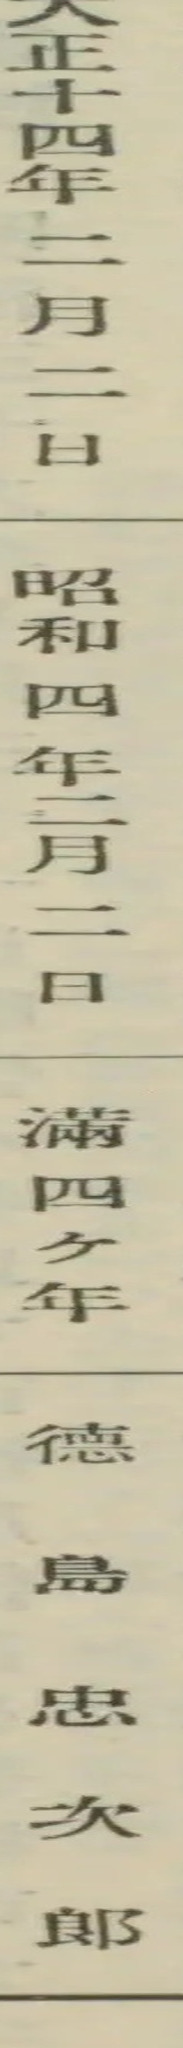大正十四年二月二日昭和四年二月三日満満一年四年徳島忠次郎
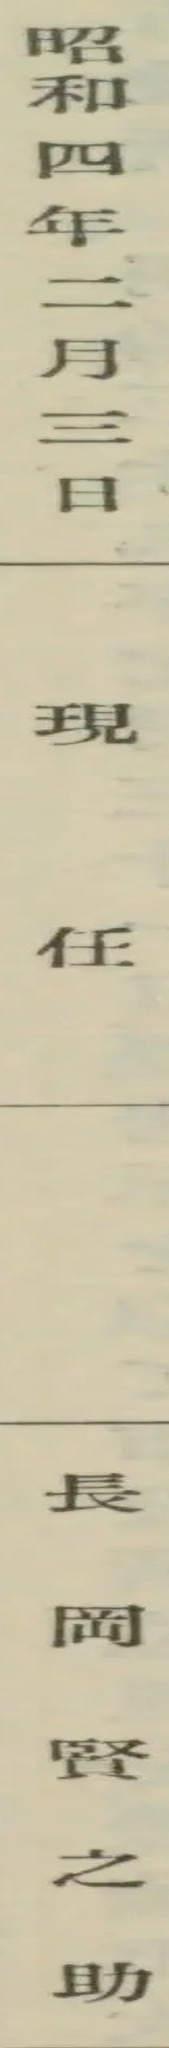昭和四年二月三日現任長岡賢之助
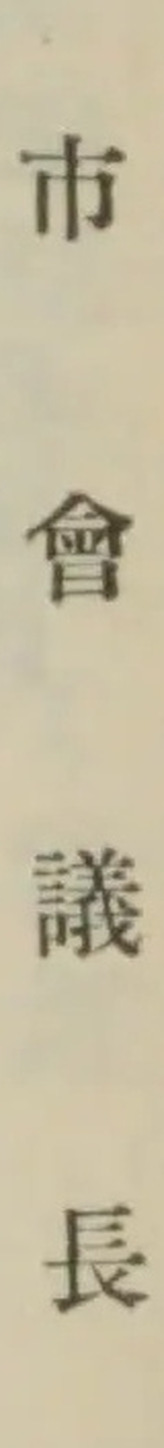市会議長
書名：豊橋市水道誌
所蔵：国立国会図書館 National Diet Library, JAPAN
